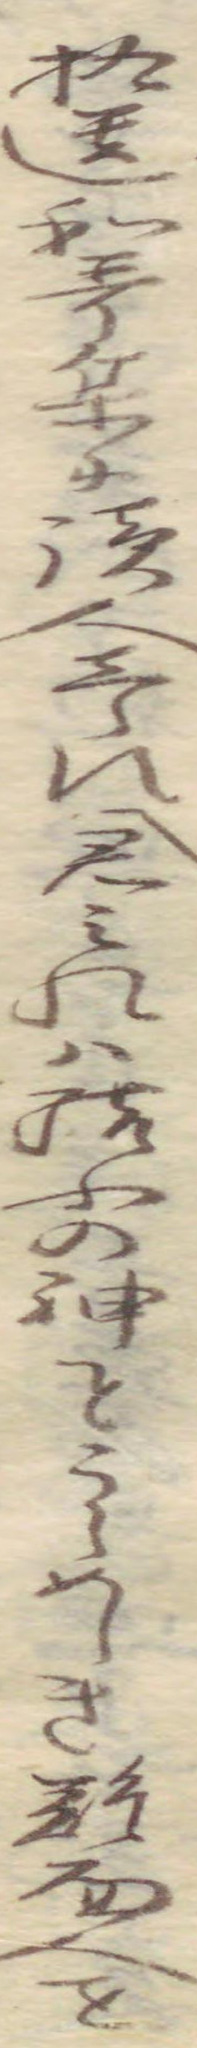拾遺和歌集に読人しらす〽君みれは結ふの神そうらめしき難面人を
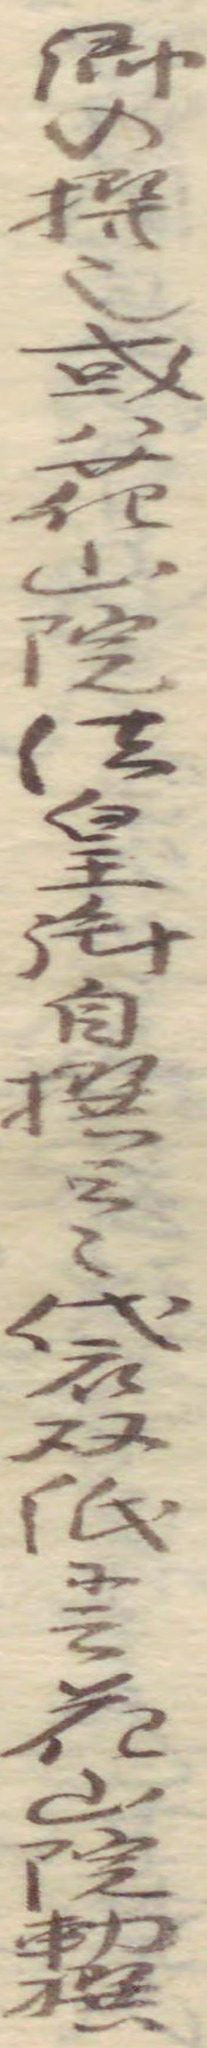卿の撰也或は花山院法皇御自撰云〻袋双紙に云花山院勅撰
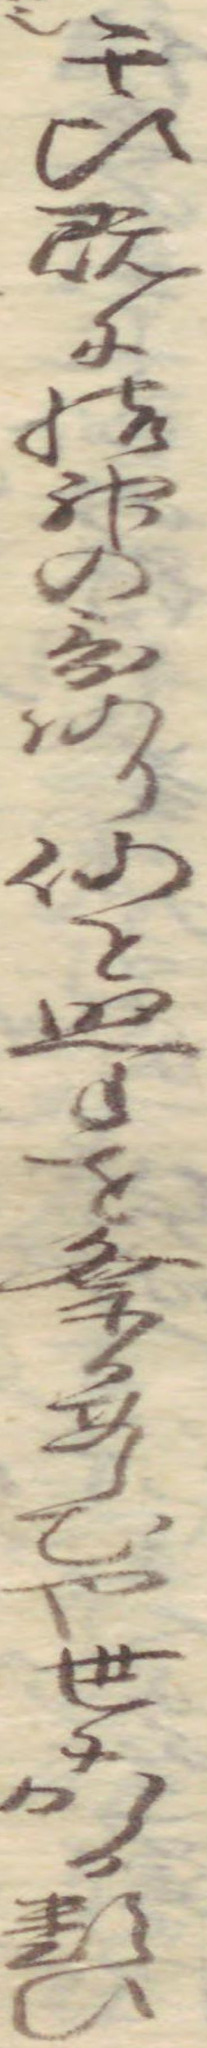其比既に結神の歌あり何そ照手を祭るならむや世にかゝる類ひ
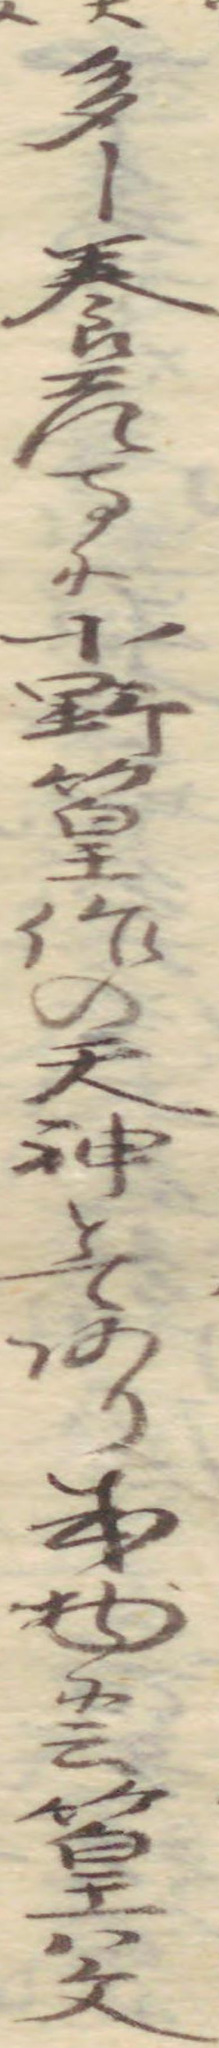多し養老寺に小野篁作の天神とてあり或物云篁は文
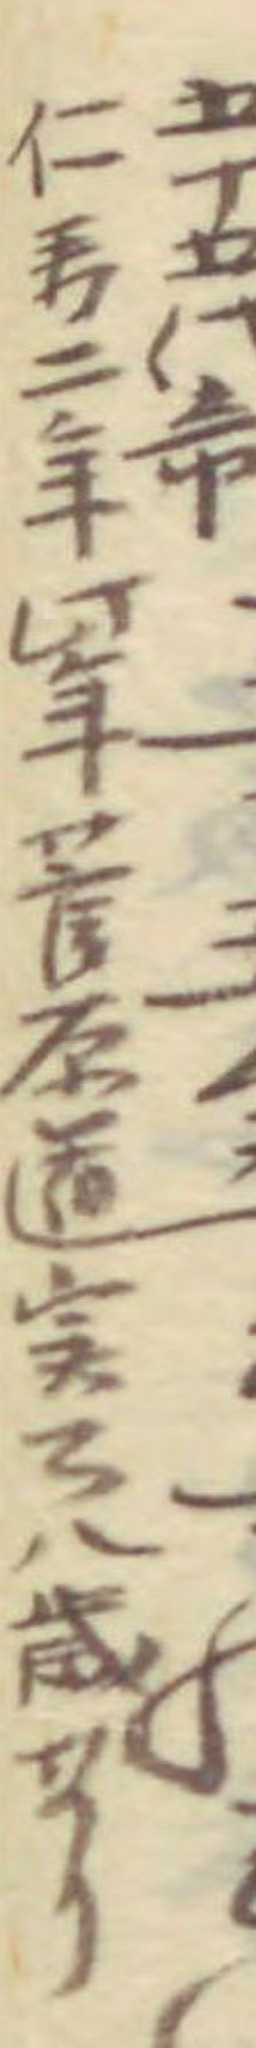仁寿二年此年菅原道実公八歳なり
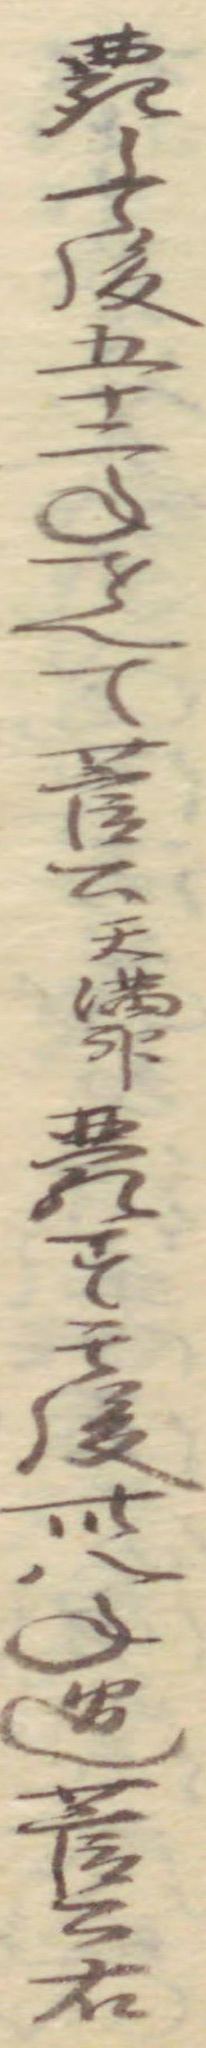薨して後五十二年をへて菅公天満神薨す其後卅八年過菅公右
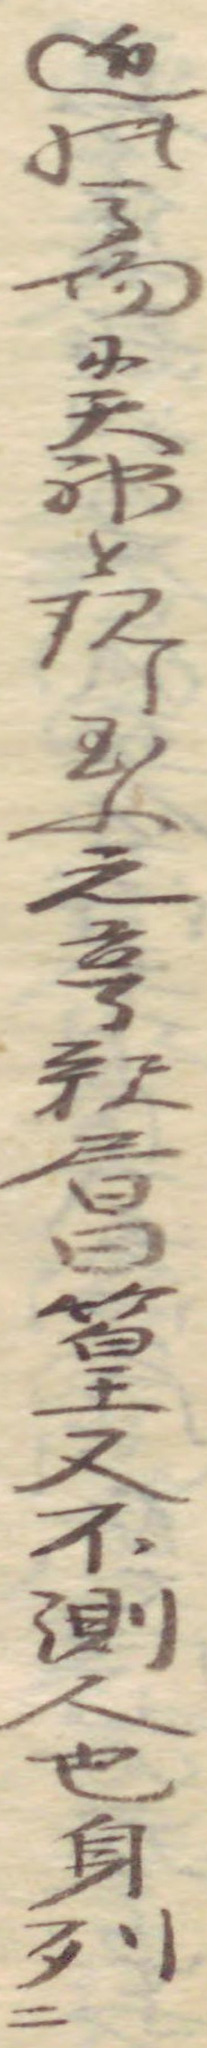近の馬場に天神と現し玉ふ元享釈書曰篁又不測人也身列
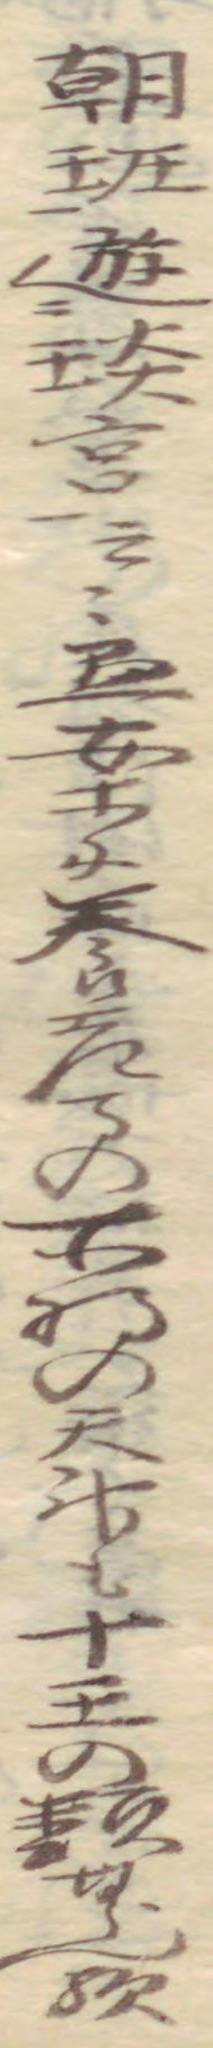朝班遊琰宮云〻懸案ニ養老寺の所持の天神も十王の類ならん歟
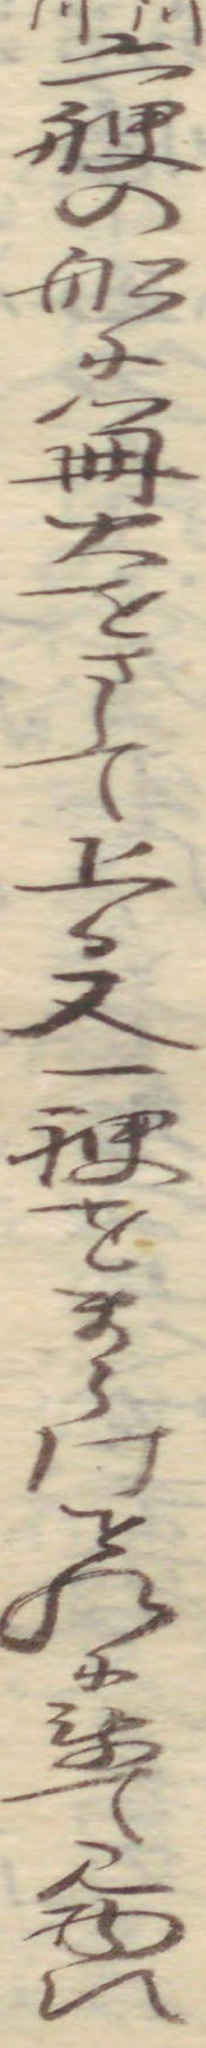六艘の船に篝火をさして上る又一艘をまうけそれに乗て見物す
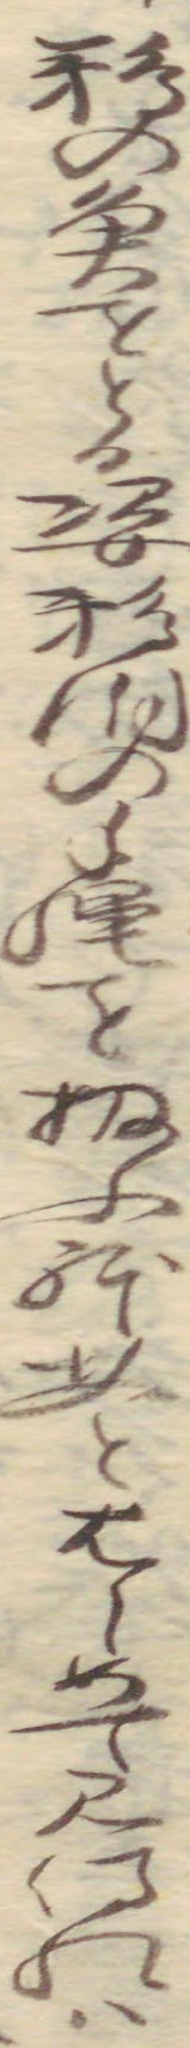鵜の魚をとる姿鵜飼の手縄を扱ふ体なとはしめて見侍れは
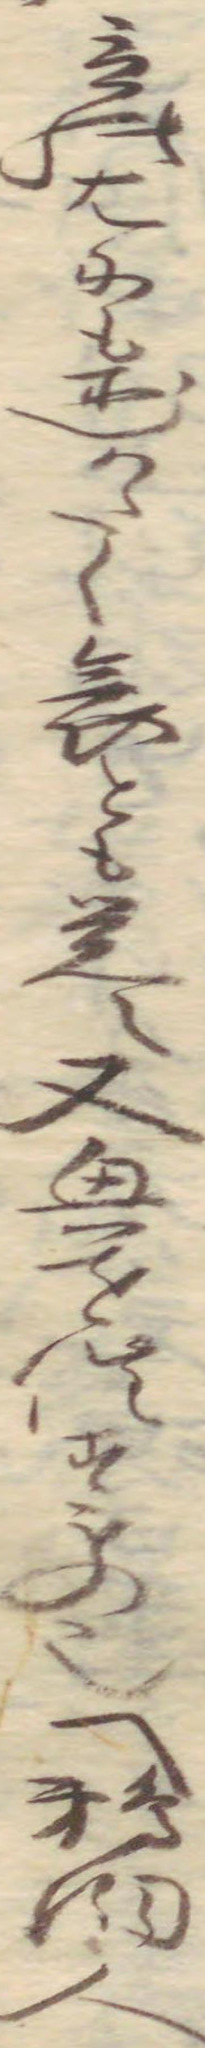言のはにも述かたく哀とも覚え又興を催すもの也〽鵜飼人
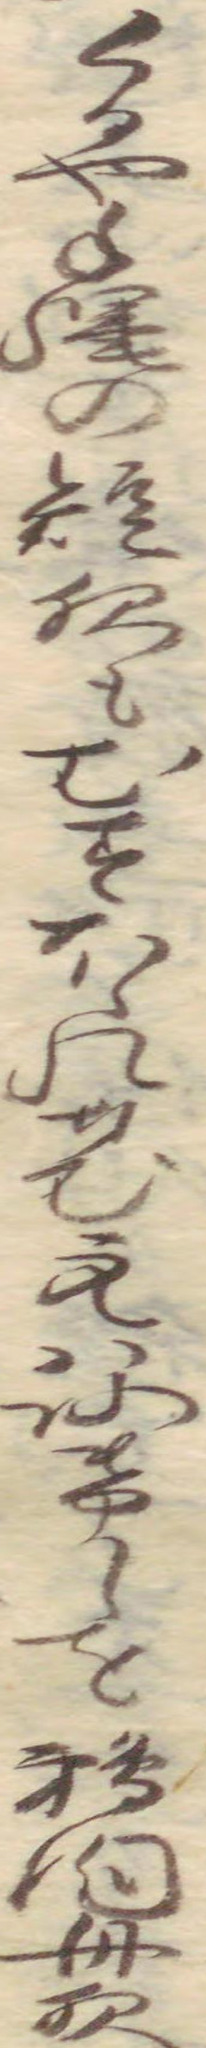くるや手縄の短夜もむすほゝれなむ空はあけしを鵜飼舟夜
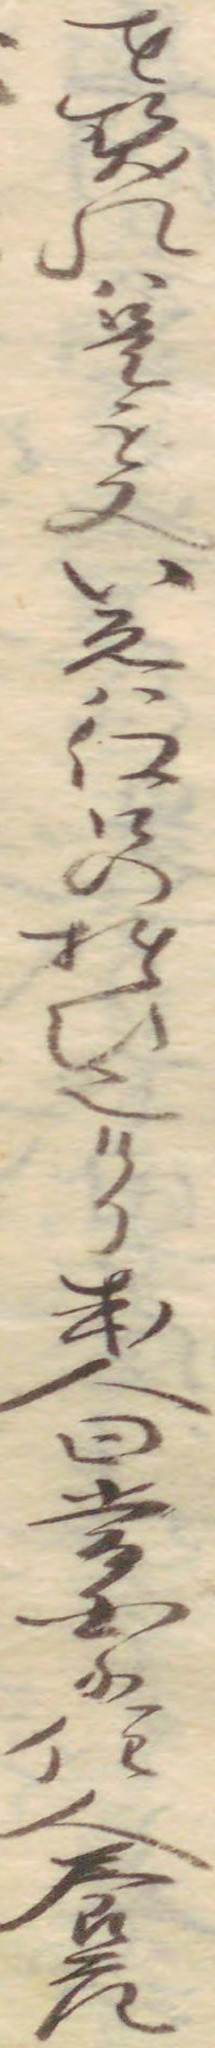を契れは是も又いゑは江口の遊也けり或人曰当国に住人養老
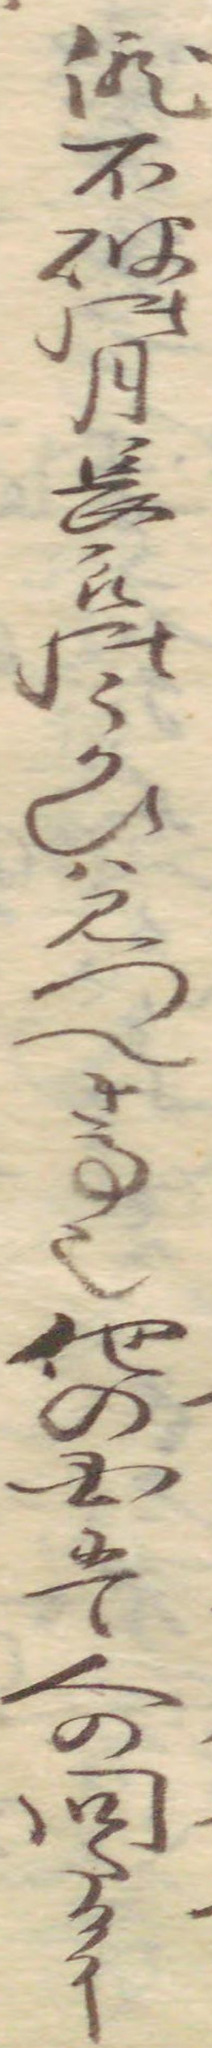瀧不破の月長良のうかひは見つへき事也他の国にて人の問たるに
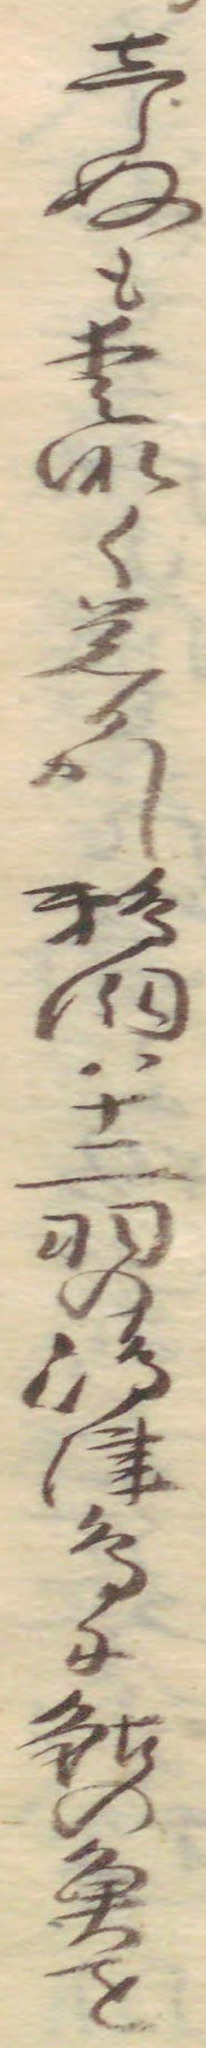しらぬも愛？なく覚るかし鵜飼は十二羽の島津鳥に鮎の魚を

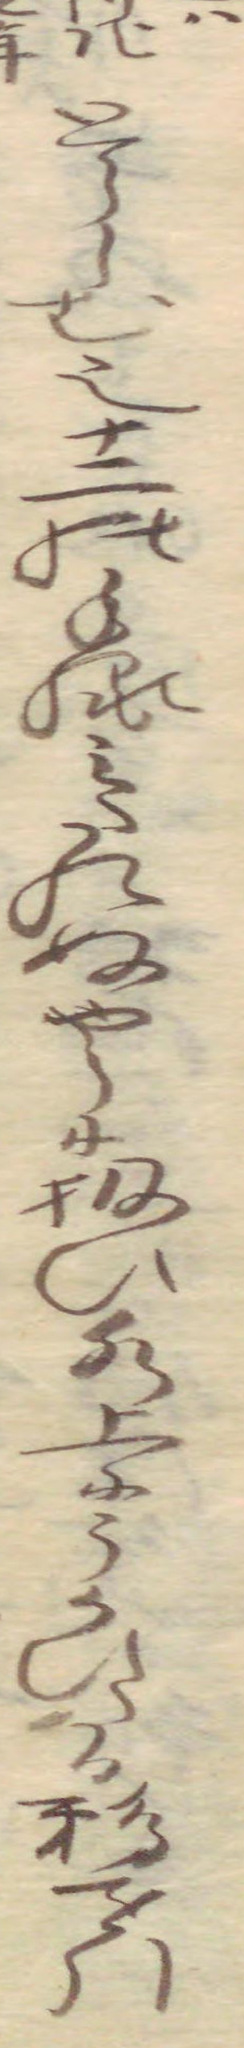とらしむ也十二の手縄みたれぬやうに扱ひ水上にうかひたる鵜を引
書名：鶯宿雑記. 巻263-264
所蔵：国立国会図書館 National Diet Library, JAPAN
